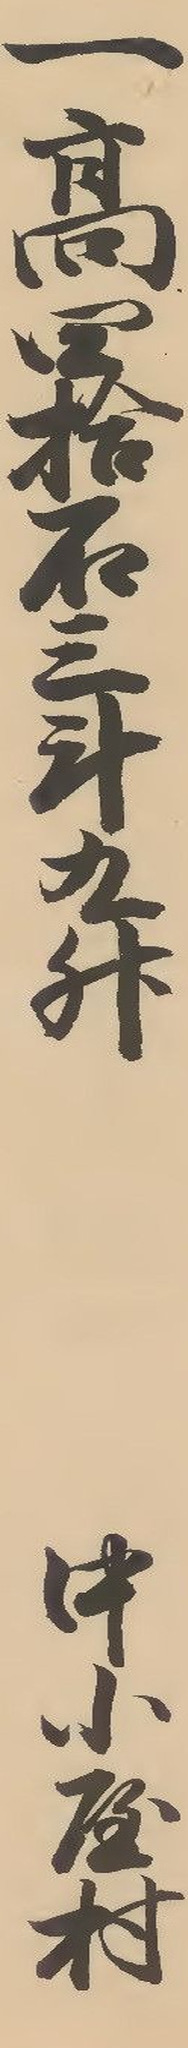一高四拾石三斗九升中小屋村

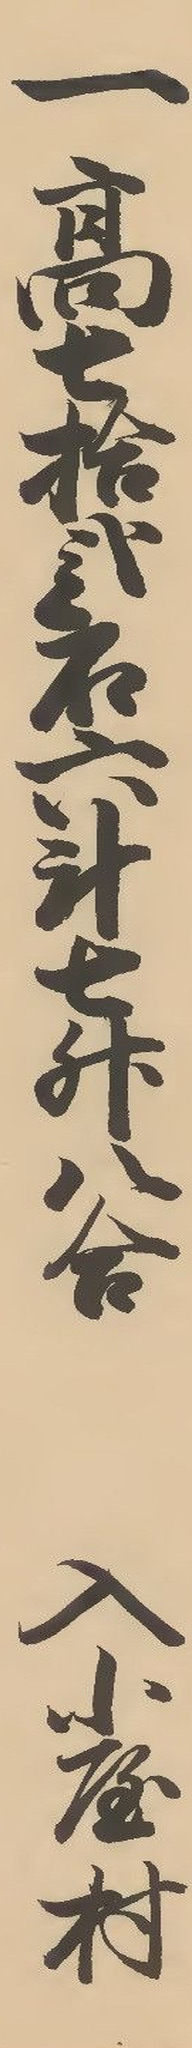一高七拾弐石六斗七升八合入小屋村
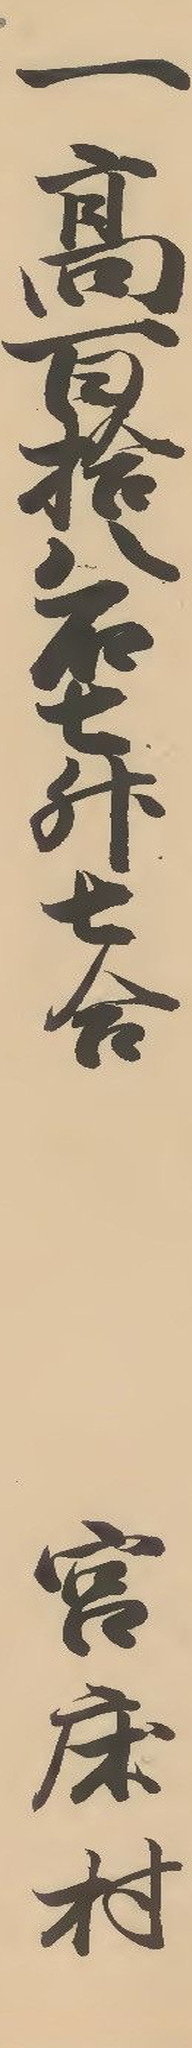一高百拾八石七升七合宮床村
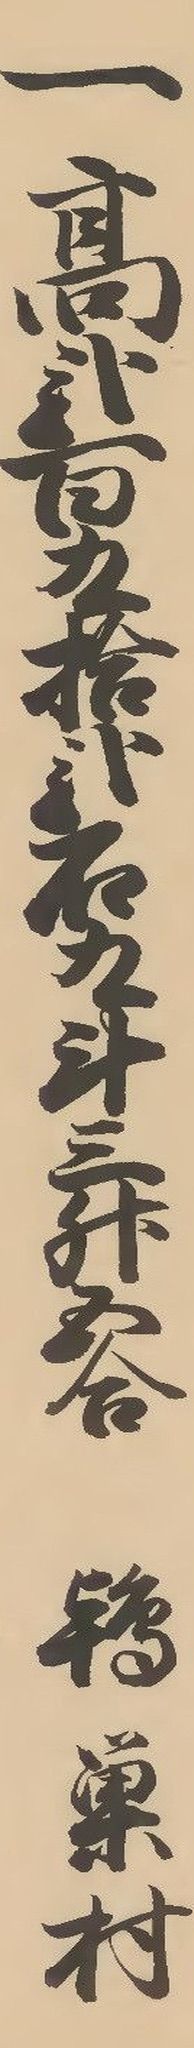一高弐百九拾弐石九斗三升五合鴇巣村
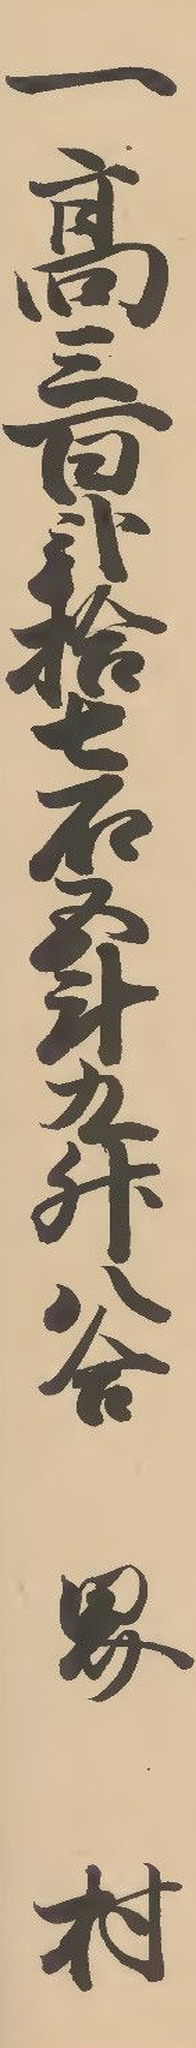一高三百弐拾七石五斗九升八合界村
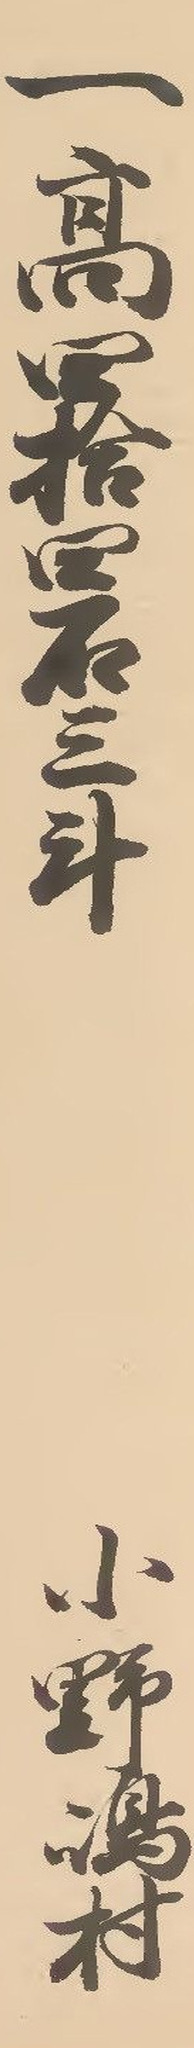一高四拾四石三斗小野島村
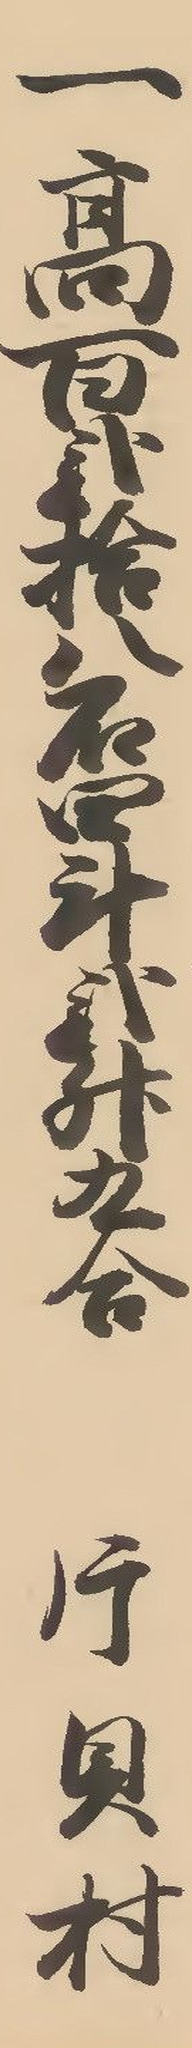一高百弐拾八石四斗弐升九合片貝村
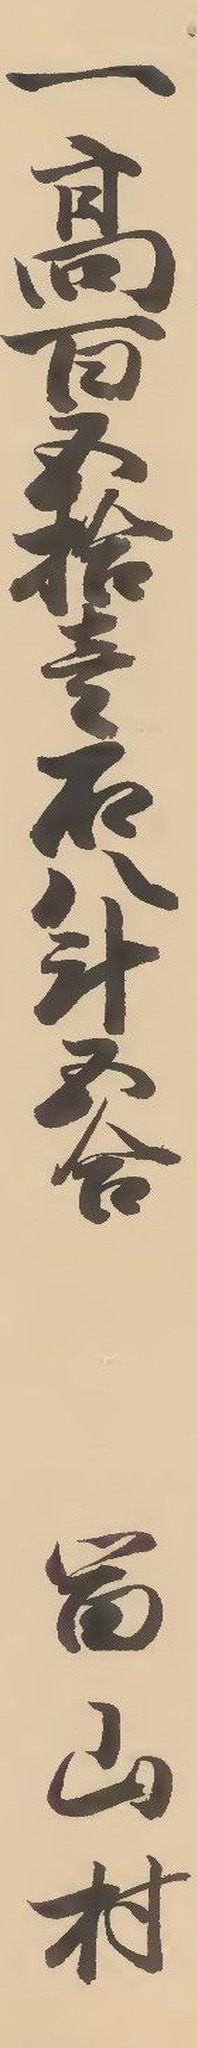一高百五拾壱石八斗五合冨山村
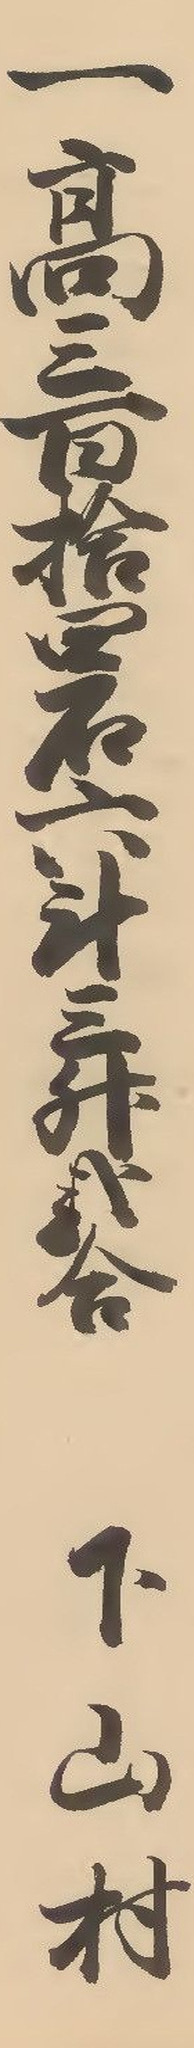一高三百拾四石六斗三升弐合下山村

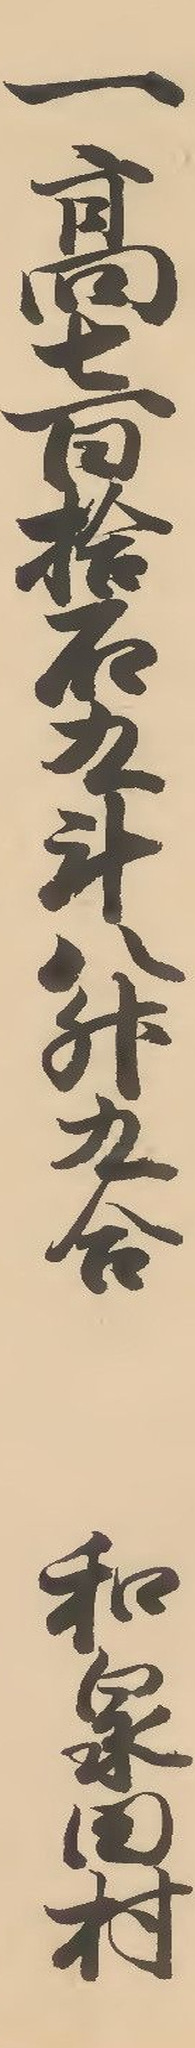一高七百拾石九斗八升九合和泉田村
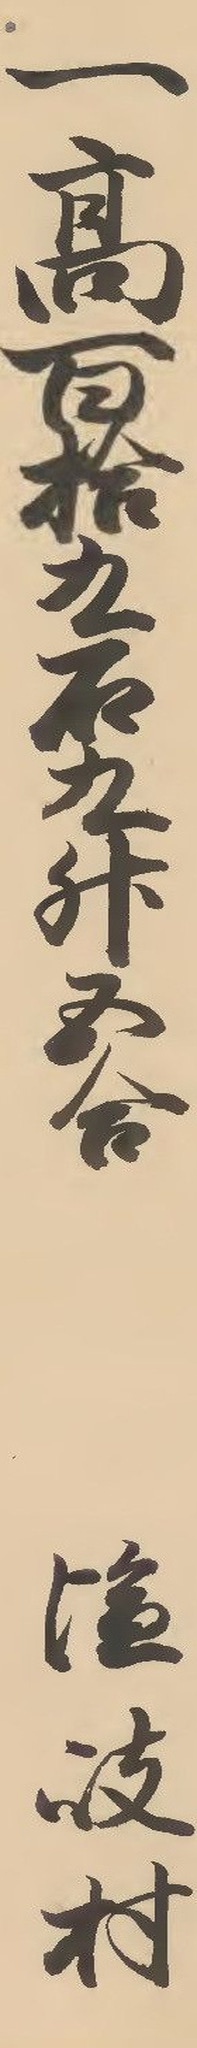一高百拾九石九升五合塩岐村
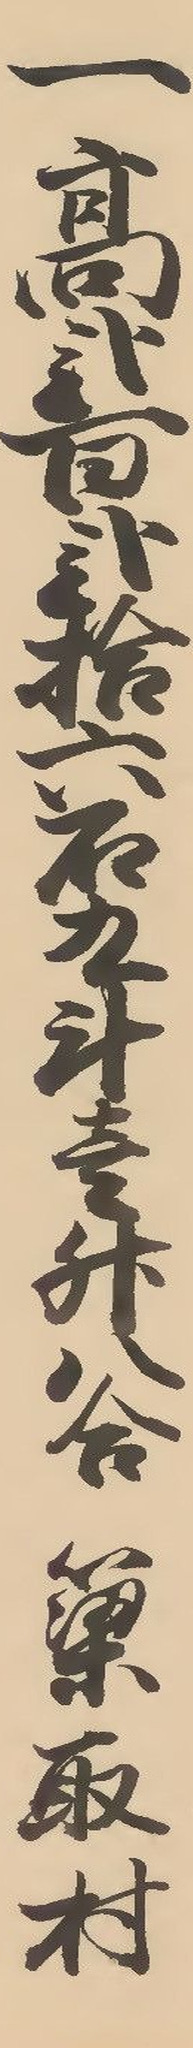一高弐百弐拾六石九斗壱升合八合簗取村
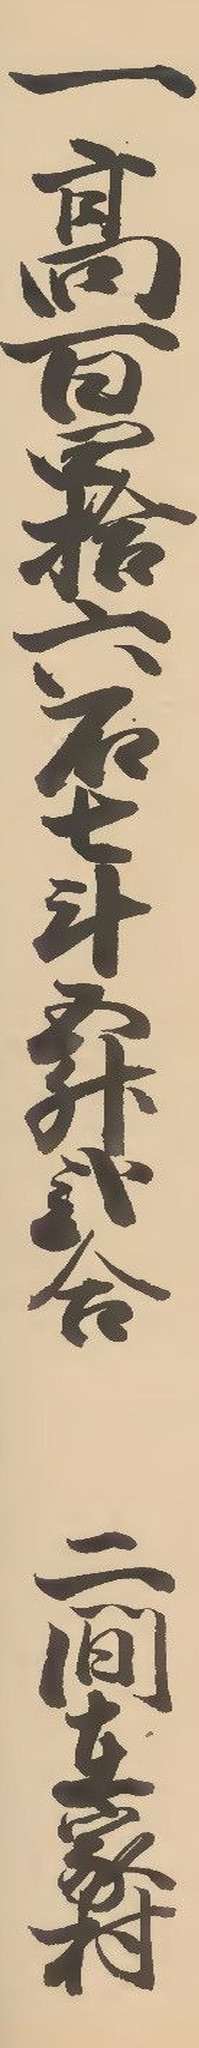一高百四拾六石七斗五升弐合二間在家村
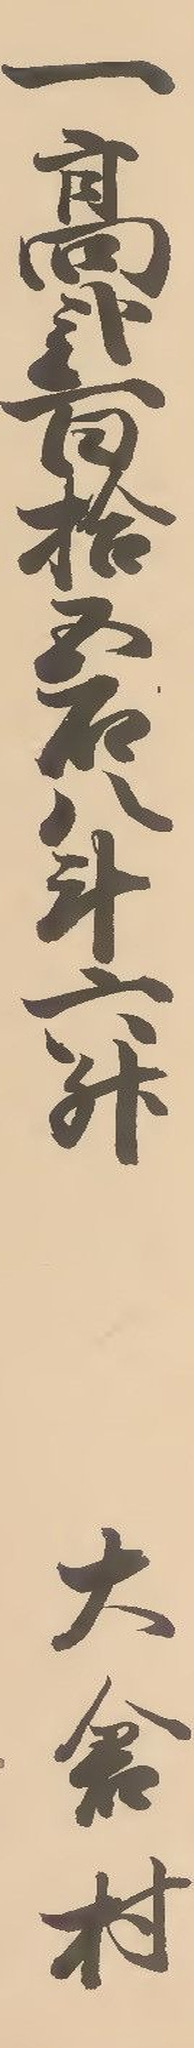一高弐百拾五石八斗六升大倉村
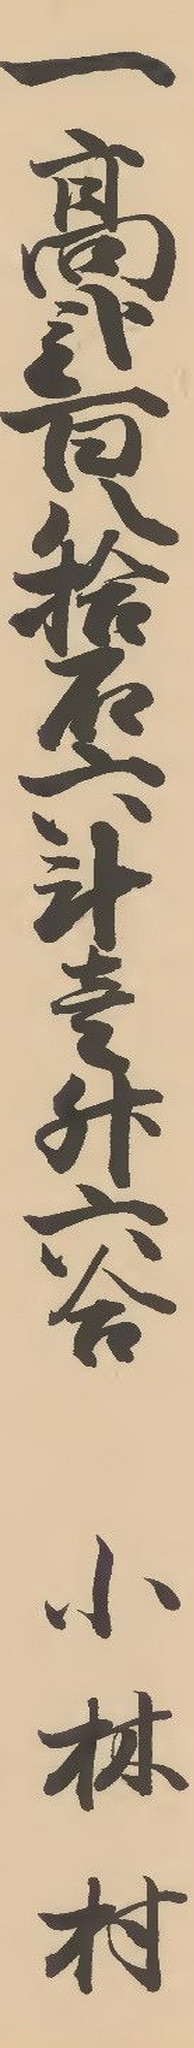一高弐百八拾石六斗壱升六合小林村
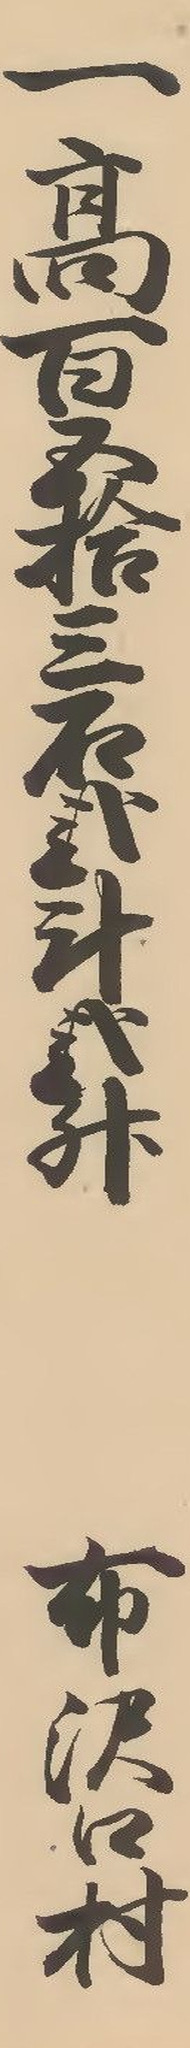一高百五拾三石弐斗弐升布沢口村
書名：陸奥国郷帳　１
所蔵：国立公文書館 National Archives of Japan
